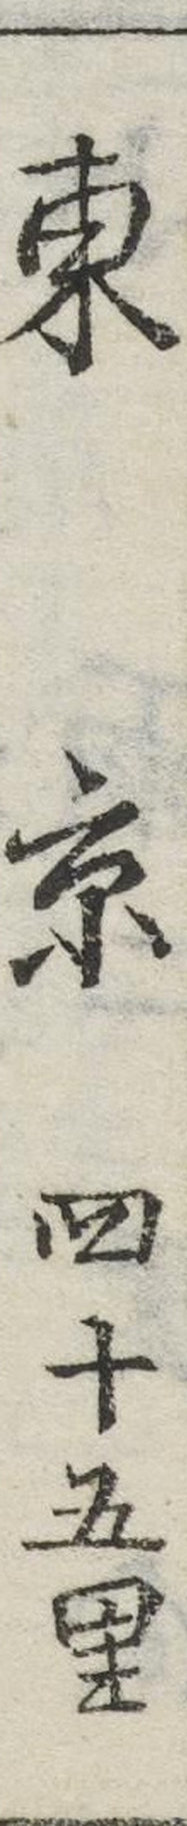東京四十五里
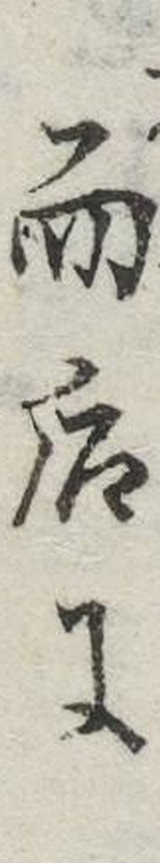而后に
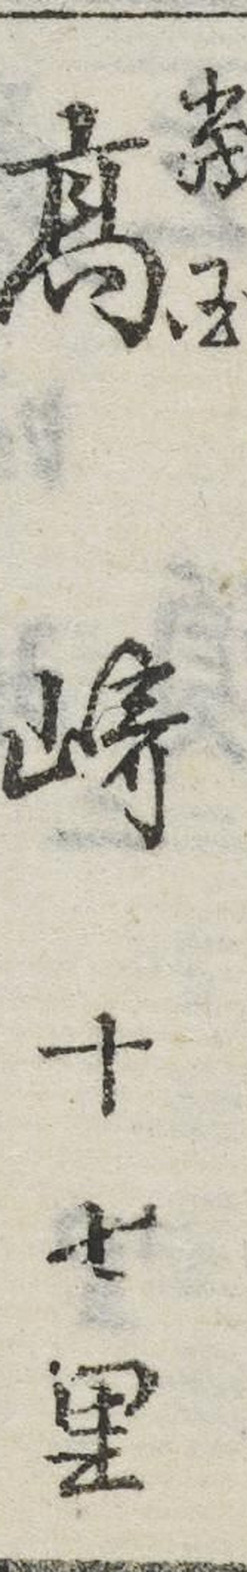高崎十七里
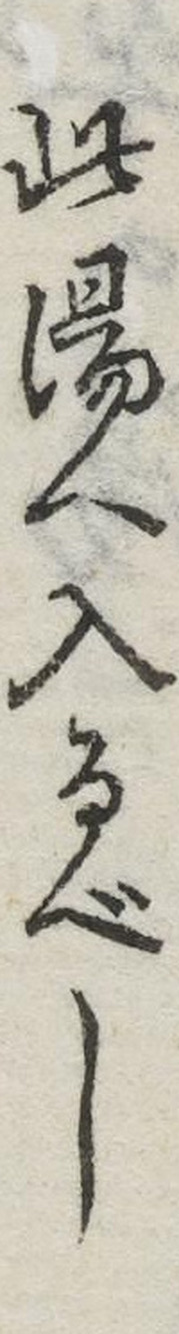此湯へ入るべし
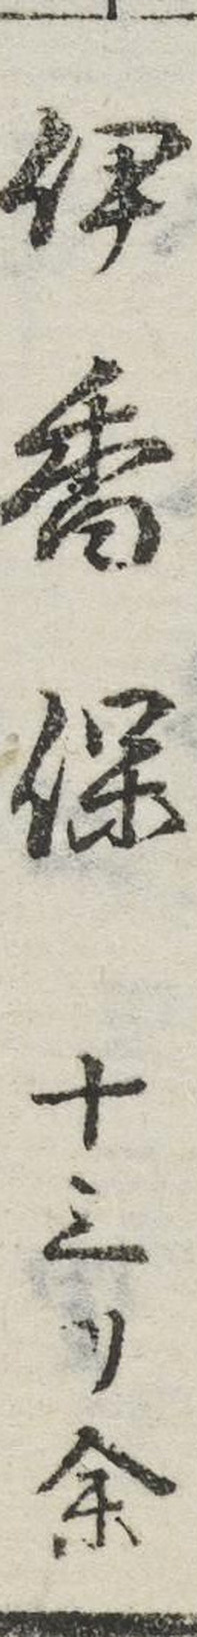伊香保十三リ余
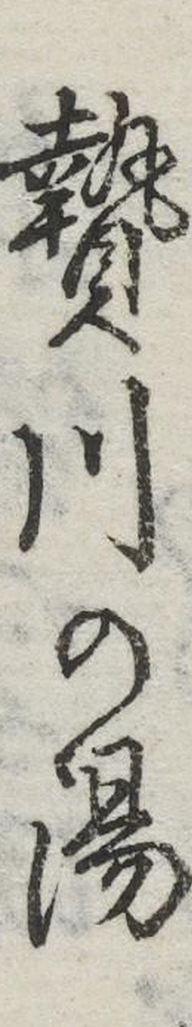贄川の湯
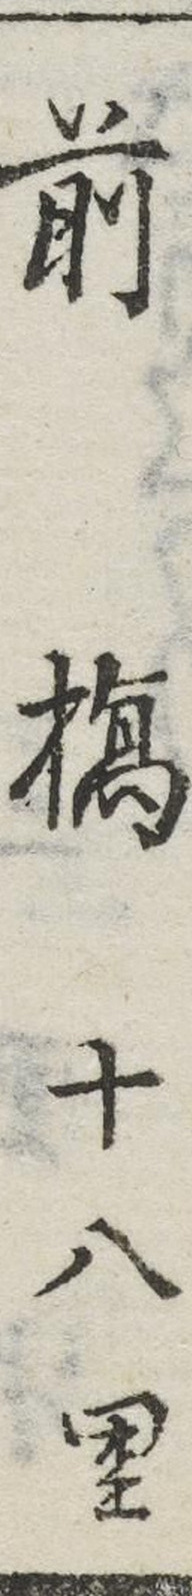前橋十八里
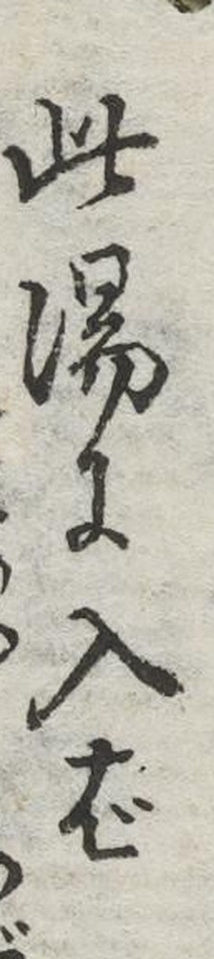此湯に入ば
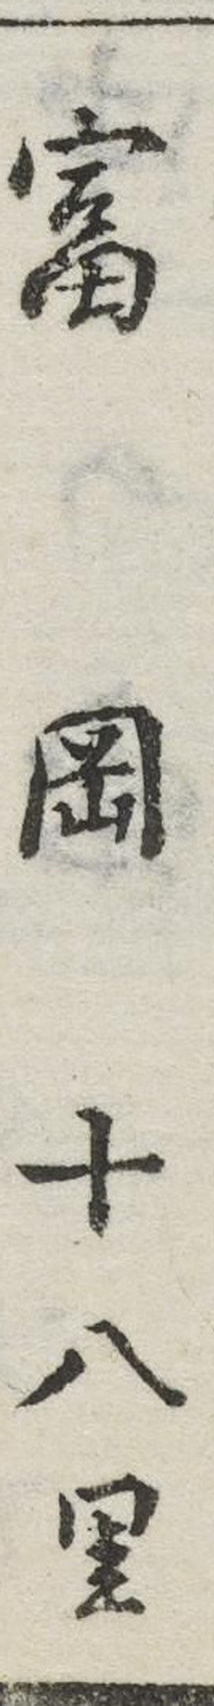富岡十八里
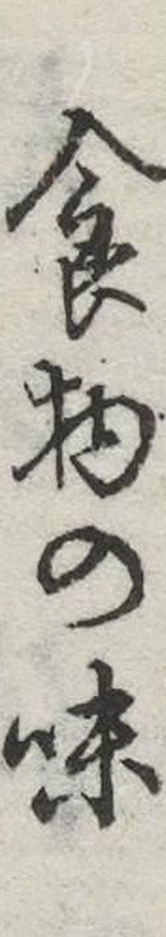食物の味
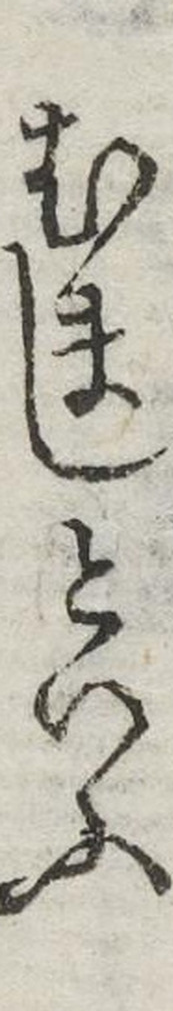むましといふ
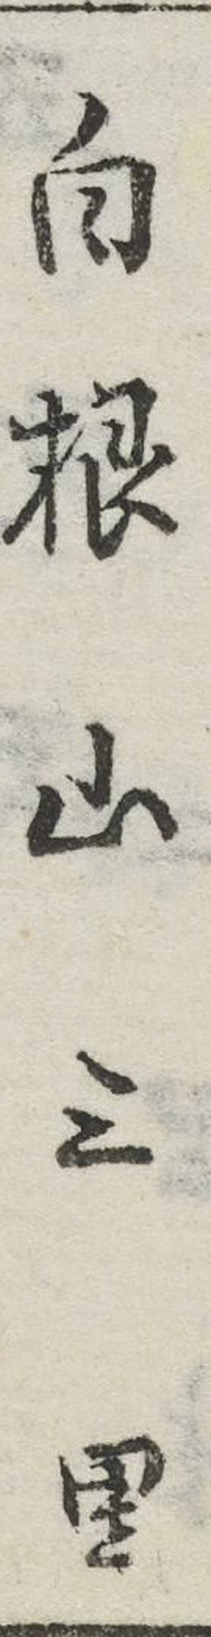白根山三里
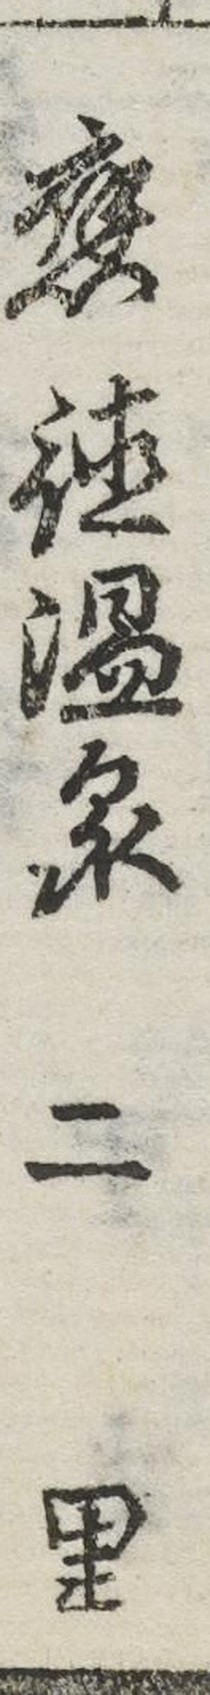応徳温泉二里
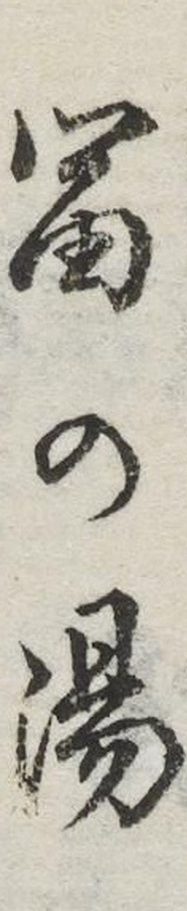富の湯
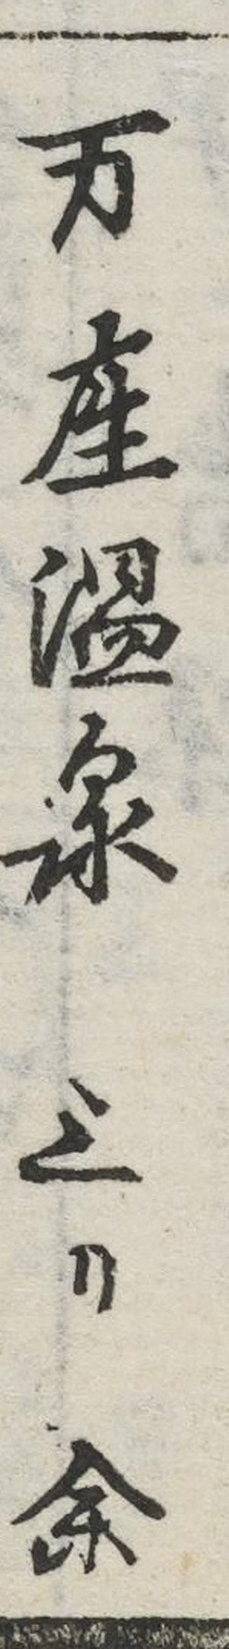万座温泉三り余
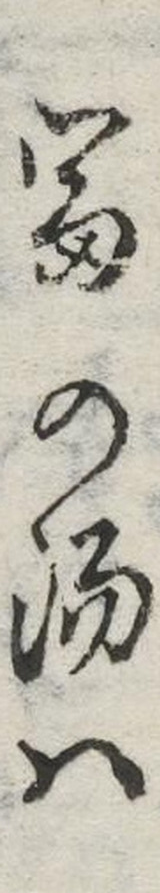富の湯は
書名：諸國温泉遊覽記　全
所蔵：東京大学地震研究所図書室 Earthquake Research Institute Library, The University of Tokyo, JAPAN
